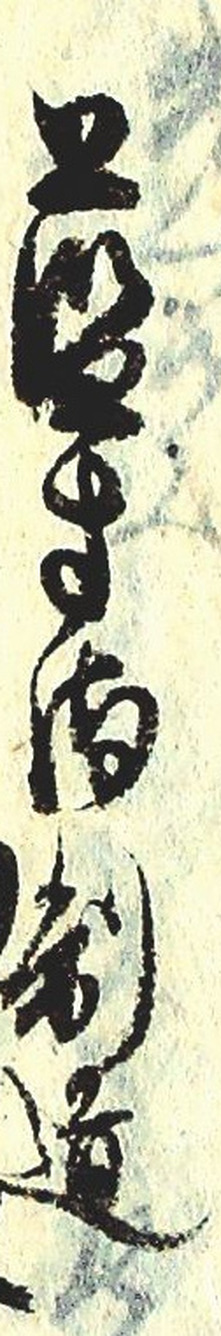藍方御制道
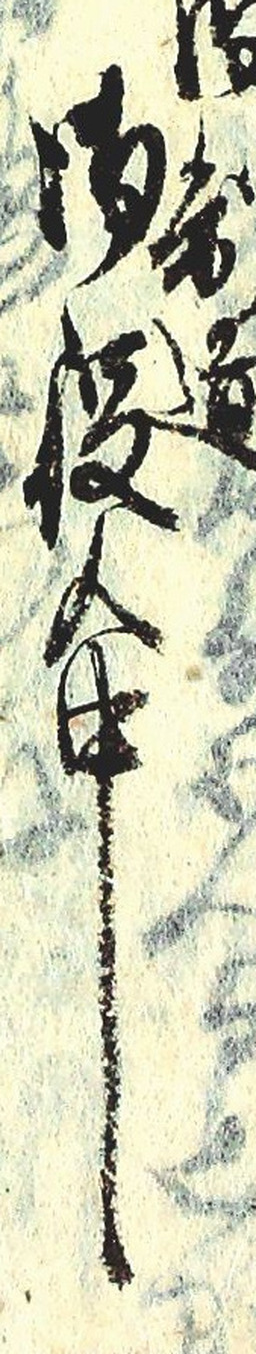御役人中
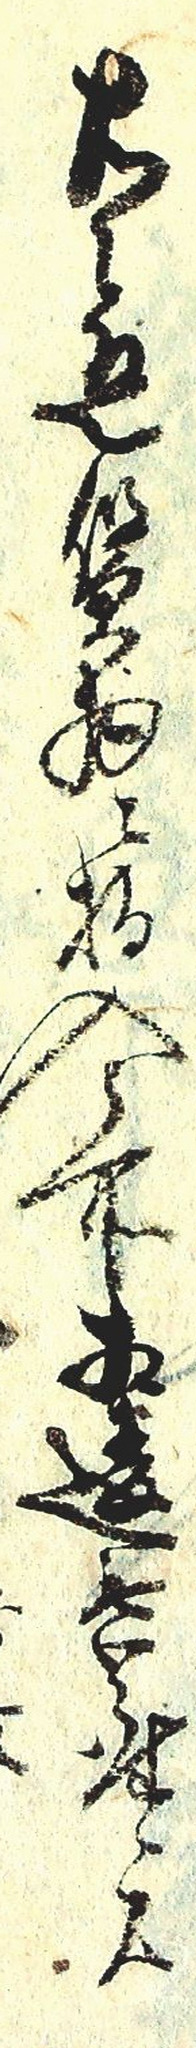右之通質物に指入候所相違無御座候以上
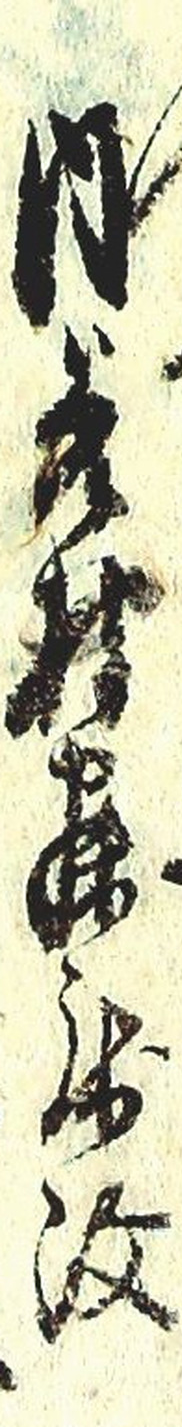内谷村寐床改
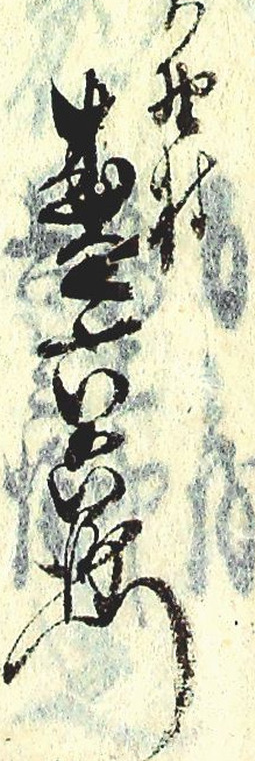盛六右衛門
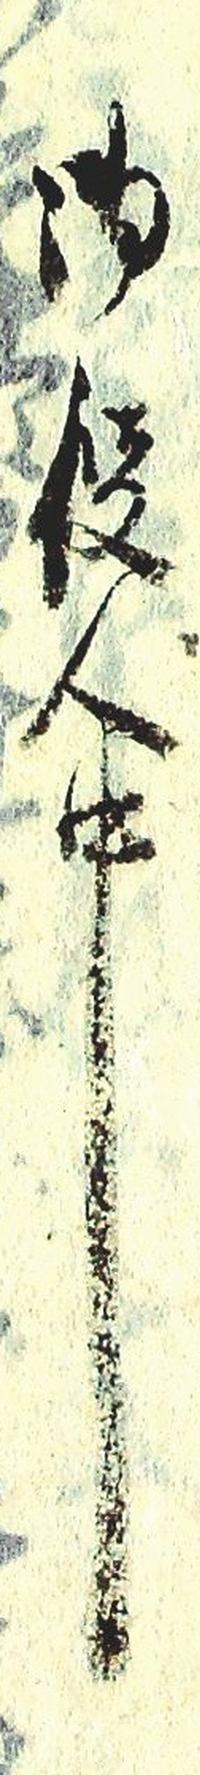御役人中
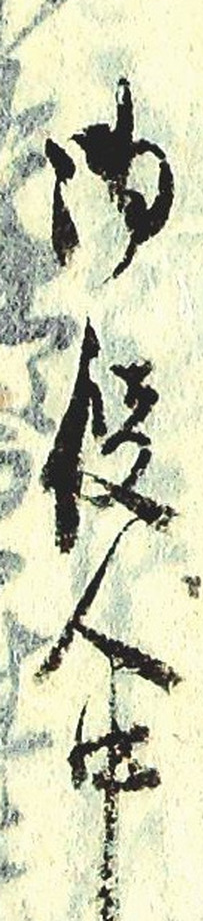御役人中
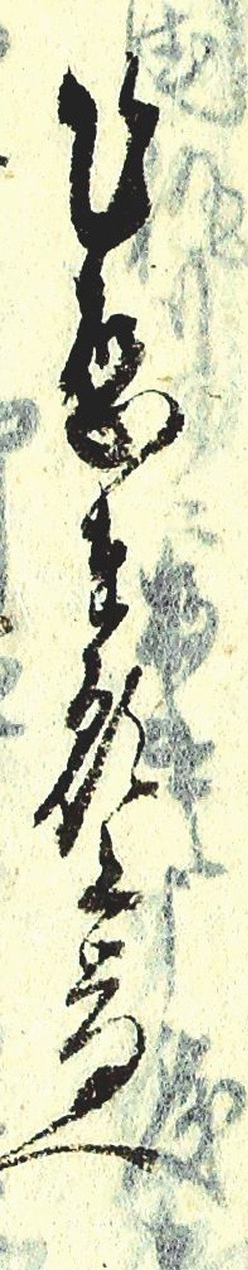乍恐奉願上覚
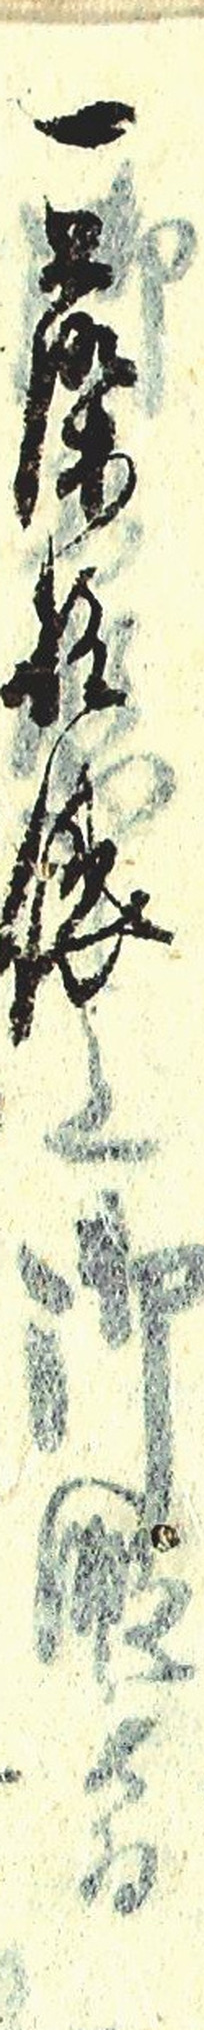一蒅拾俵
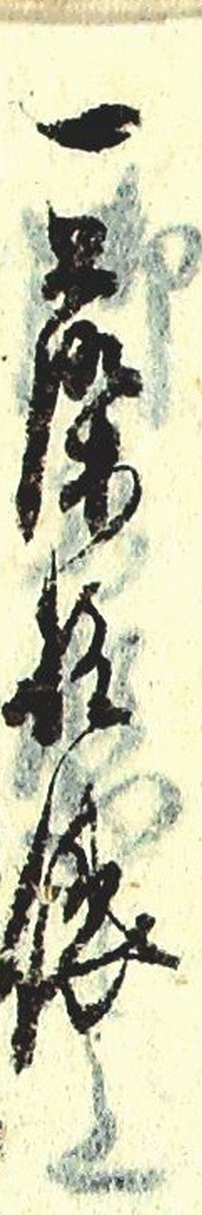一蒅拾俵
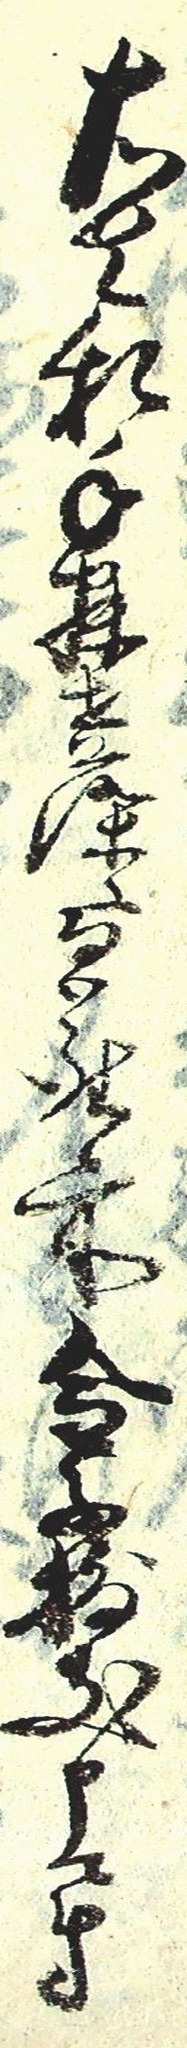右は私手寐せ蒅にて御座候所金子指支申に付
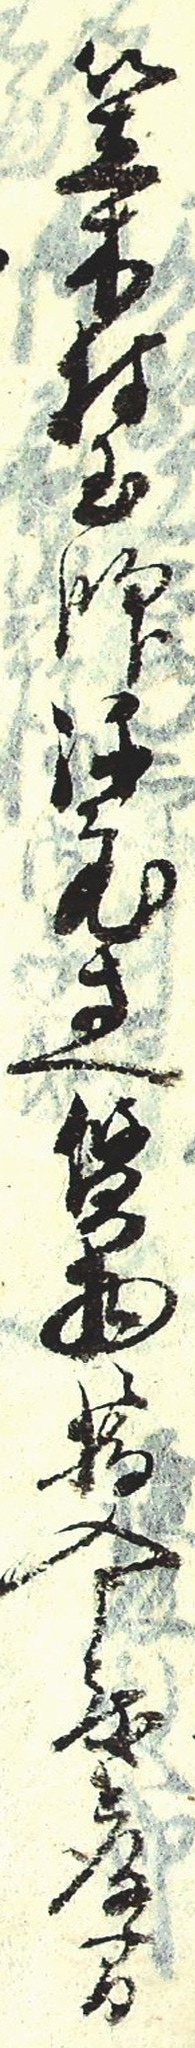笠木村玉師弥蔵方へ質物に指入申度奉存候間
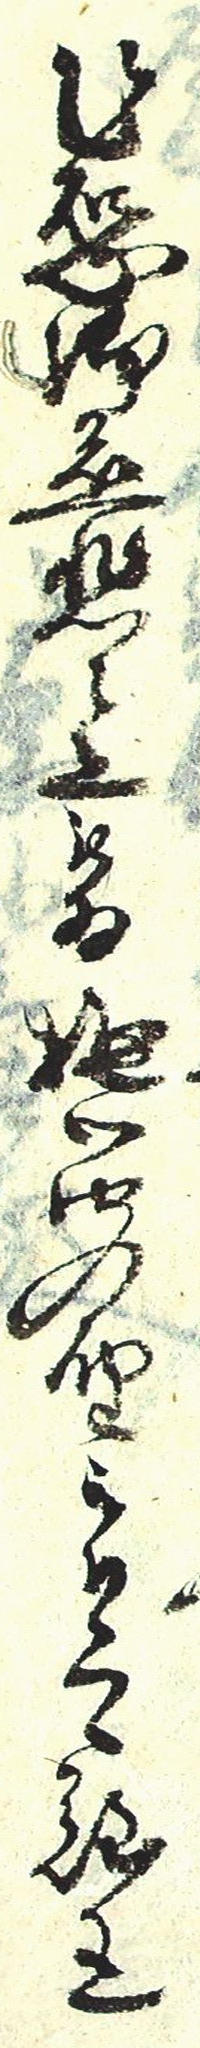乍恐御慈悲之上被為遊御聞届被下候はゝ難有

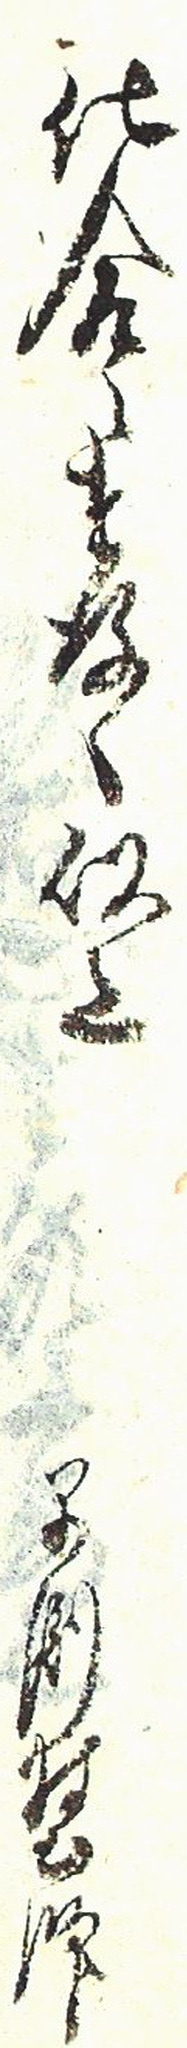仕合に奉存候以上早淵村玉師
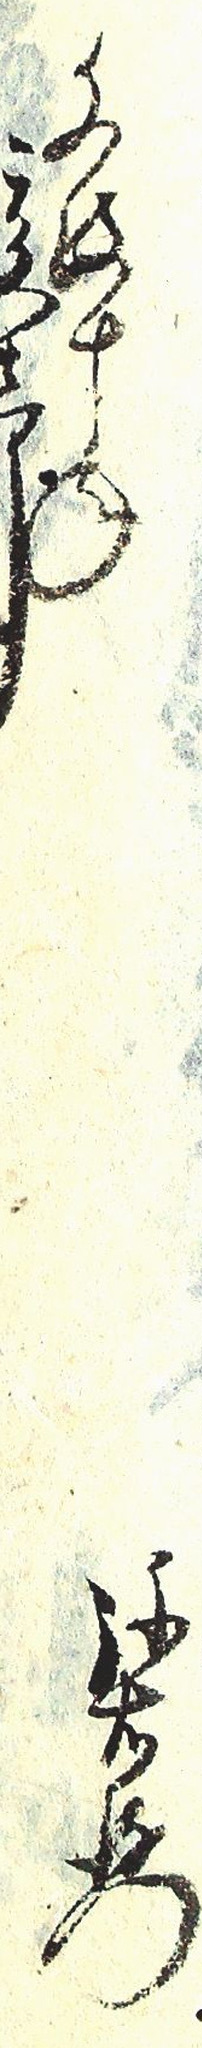文政十年弥右衛門
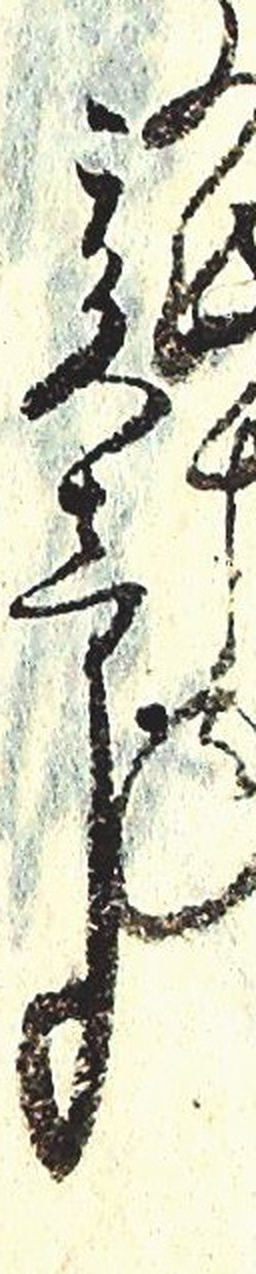亥十二月
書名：諸御願書控(弐番）
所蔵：鳴門教育大学 Naruto University of Education
